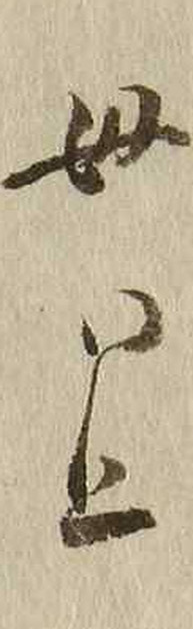母同上
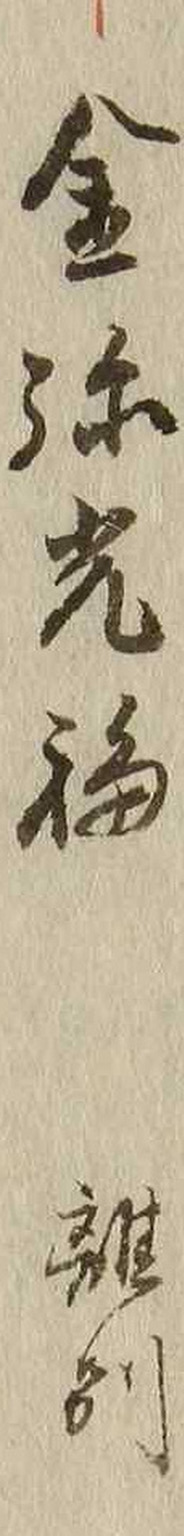金弥光福離別
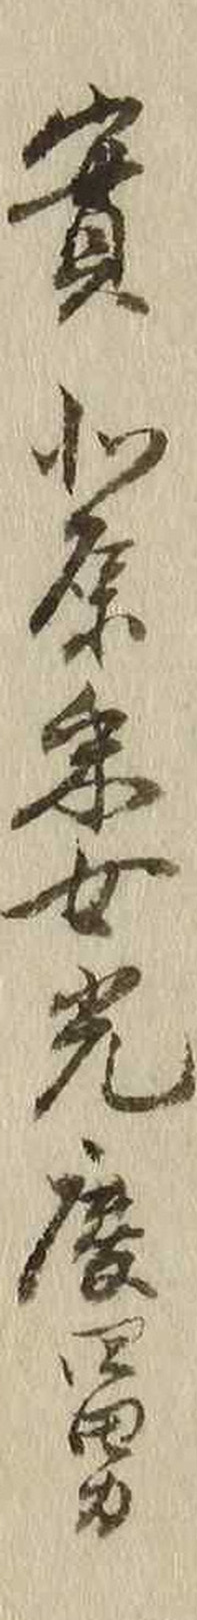実北原采女光慶四男
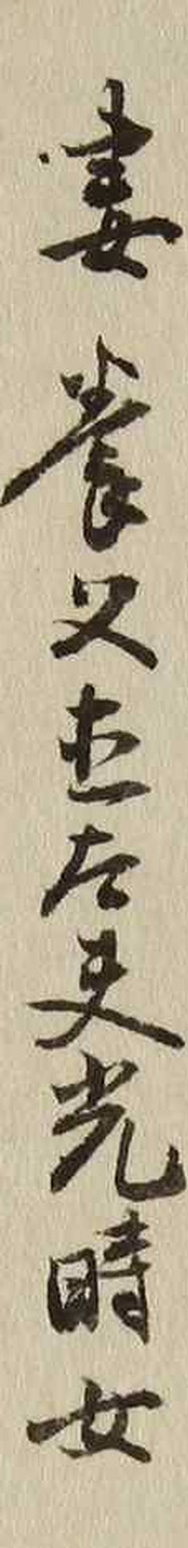妻養父直太夫光時女
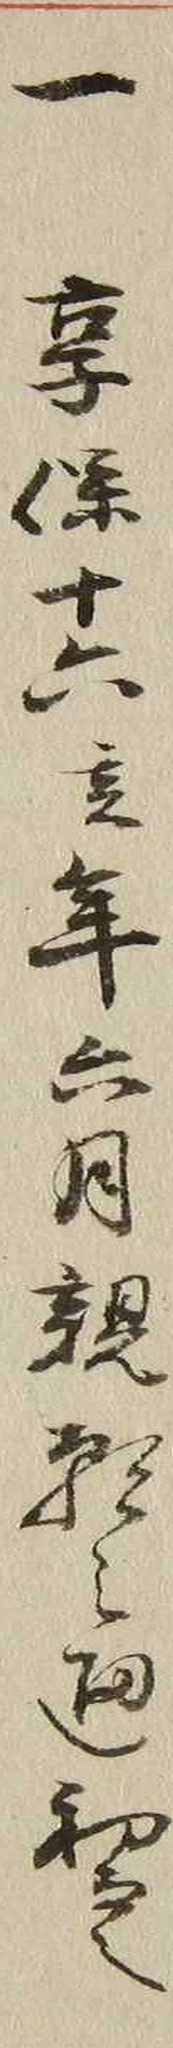一享保十六亥年六月親願之通初而之
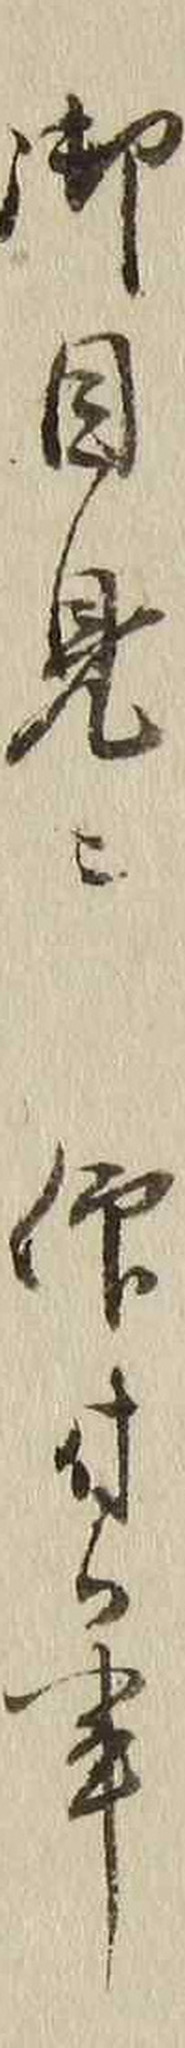御目見被仰付候事
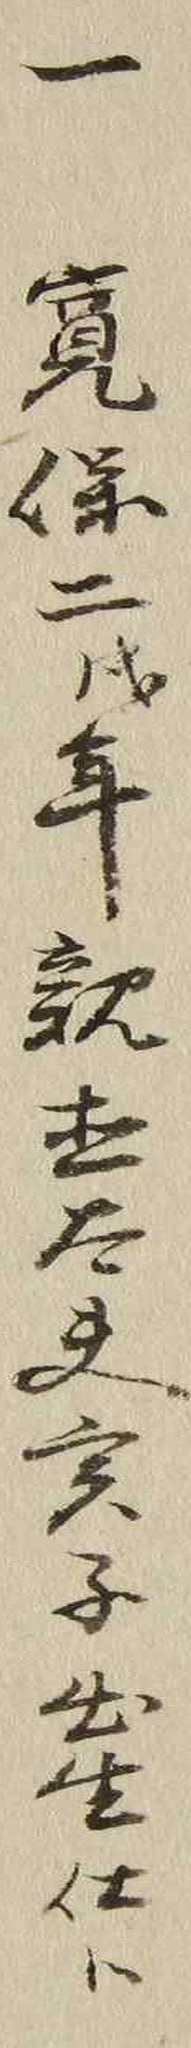一寛保二戌年親直太夫実子出生仕候
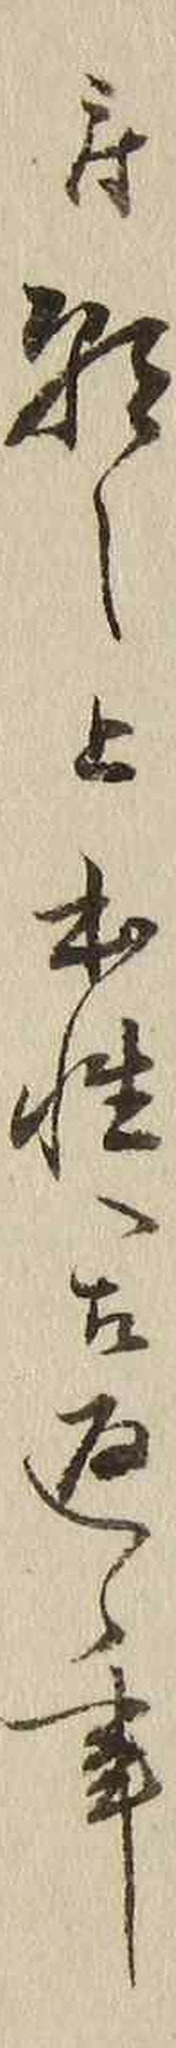ニ付願之上本性へ相返候事
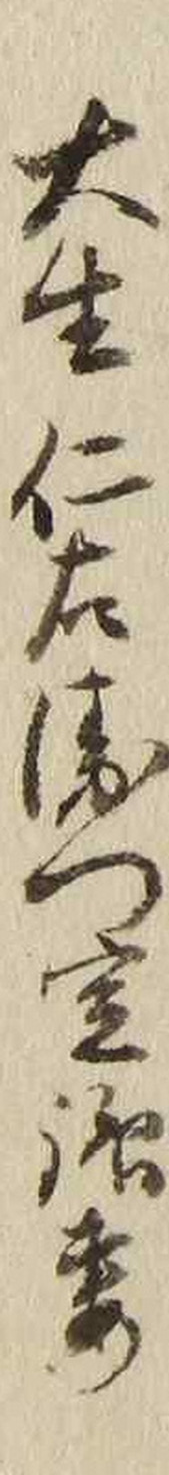女大生仁右衛門定強妻

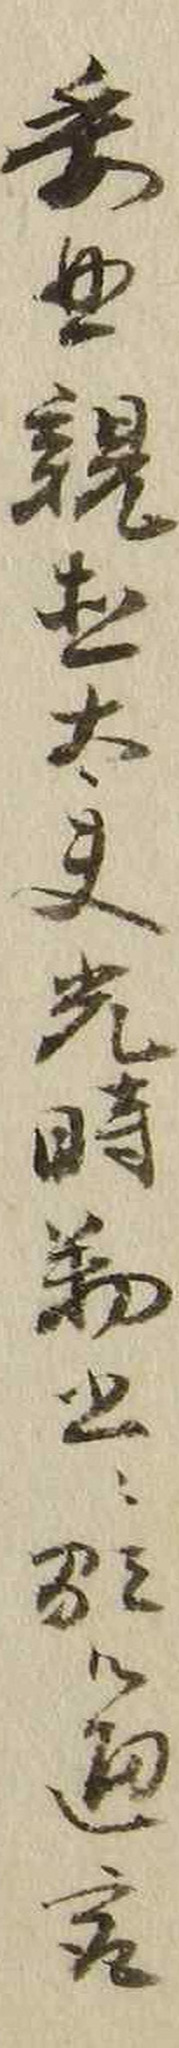委曲親直太夫光時勤書ニ顕候通最
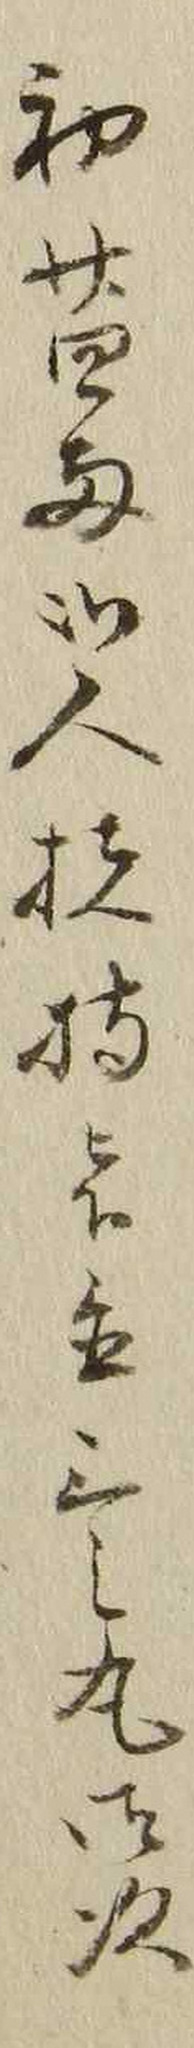初廿四両弐人扶持被下置三之丸御次
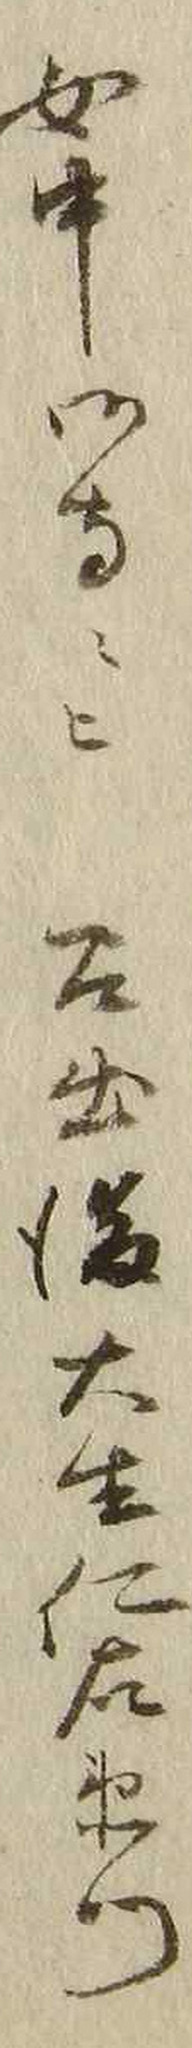女中御守ニ被召出後大生仁右衛門
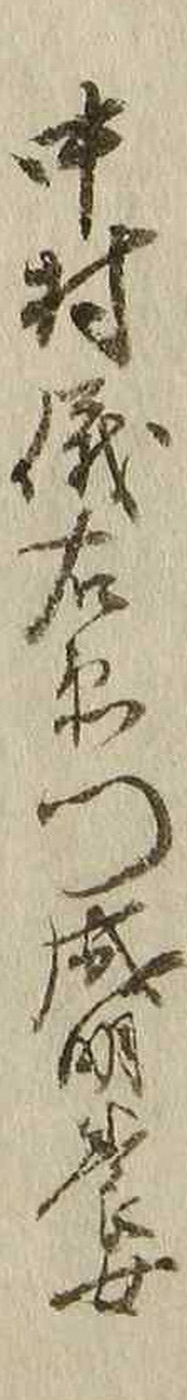女中村儀右衛門成明養女
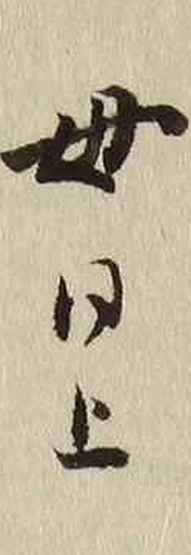母同上
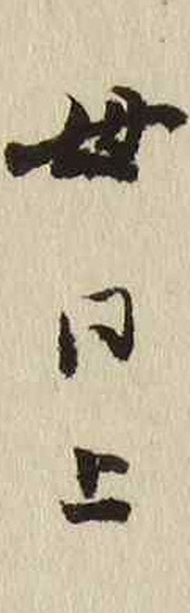母同上
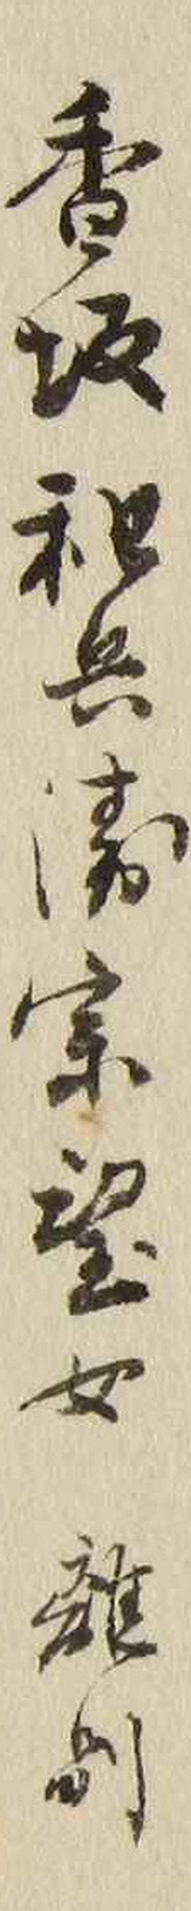香坂和兵衛宗望女離別
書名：諸士系譜　巻之225　ま之部6
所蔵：会津若松市立会津図書館
